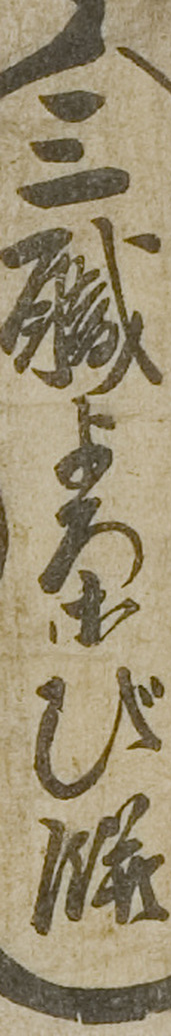三職よろこび餅
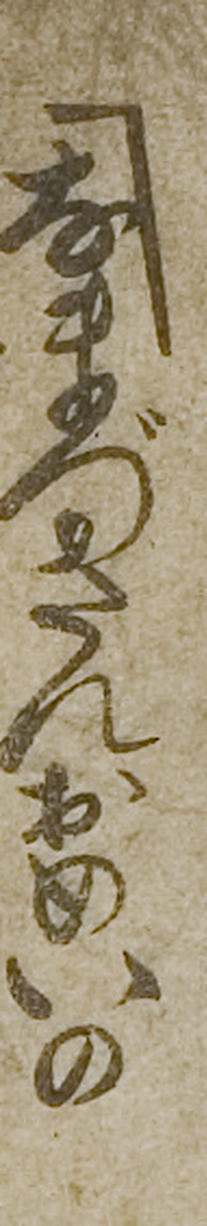〽なまづさんおめいの
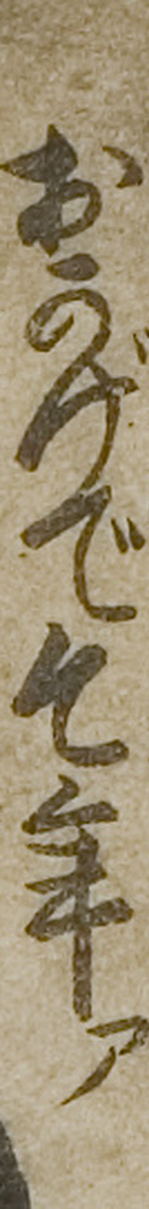おかげで今年ァ
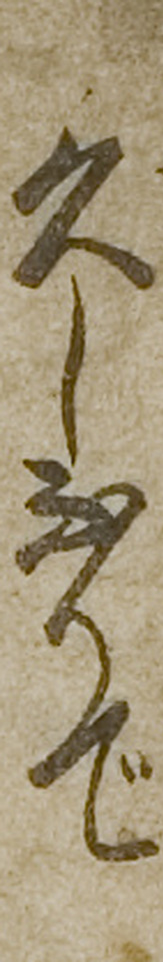久しふりで
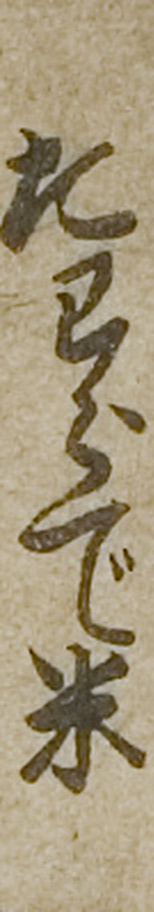たわらで米
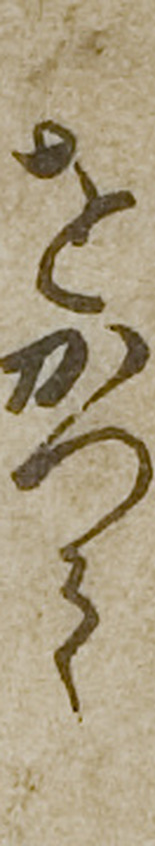をかつて
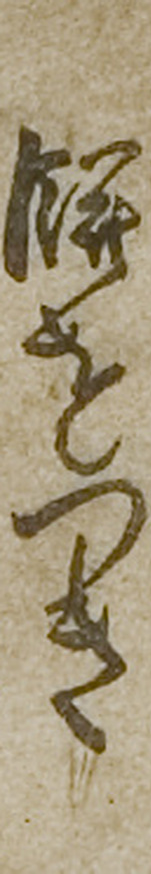餅をつき
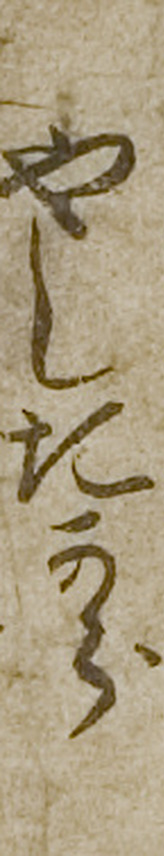やしたから
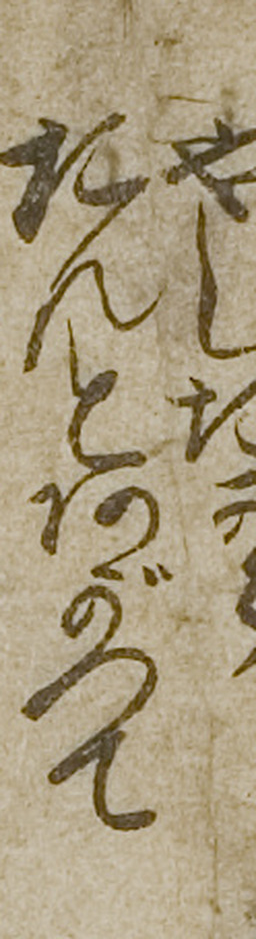たんとあがつて
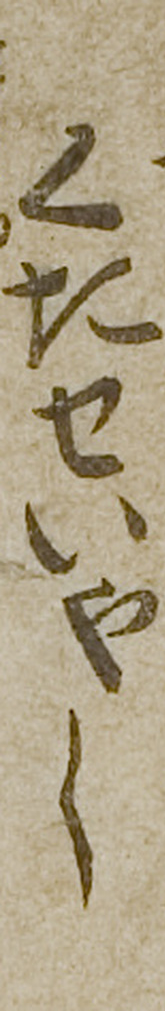くたせいやし
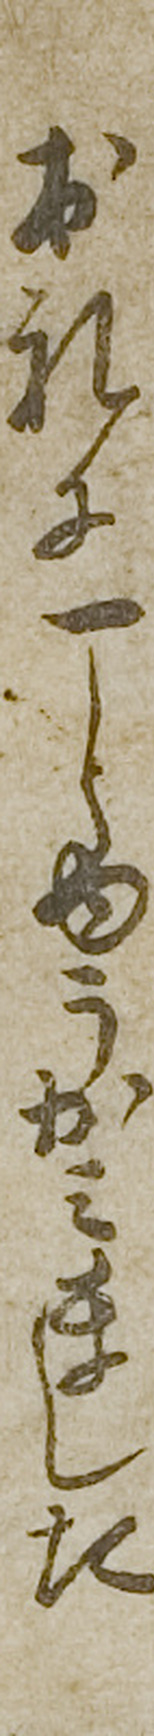お礼に一しやうかみました
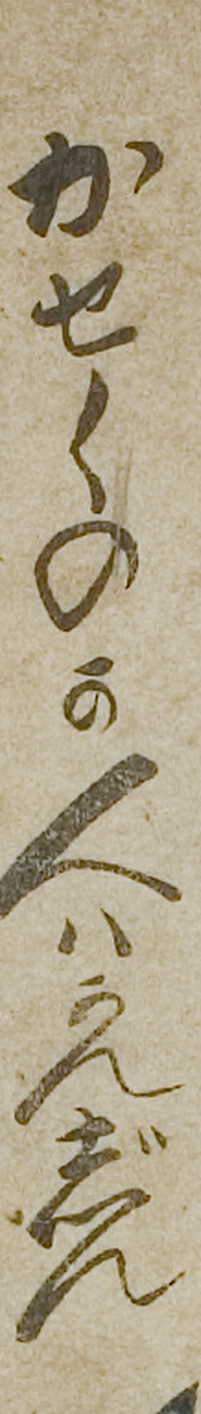かせくのか人はかんじん
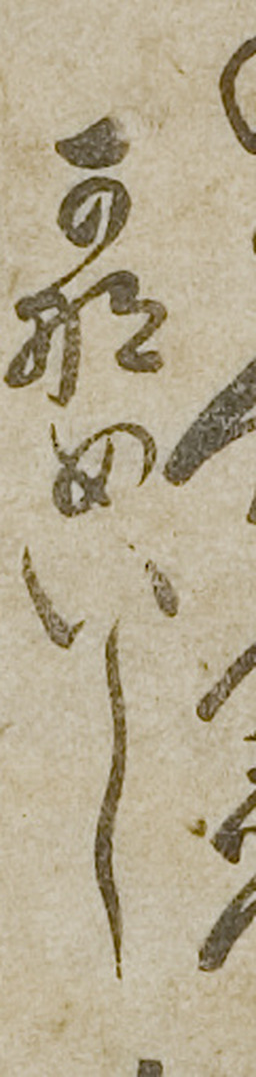かなめいし
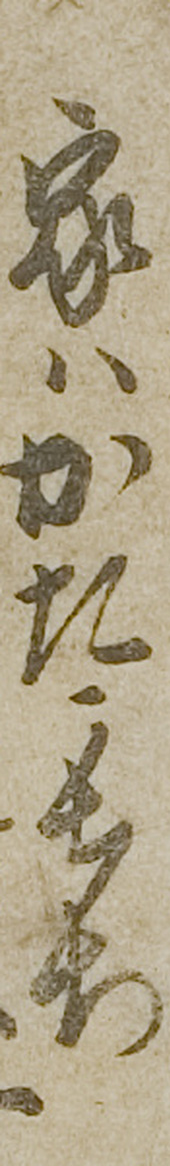家はかたもち
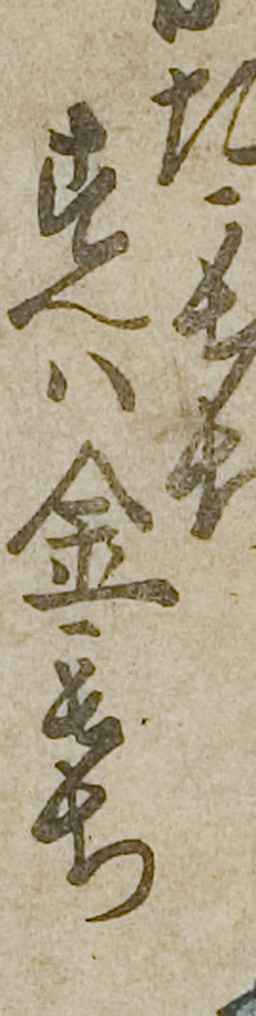すへは金もち
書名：三職よろこび餅
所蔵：東京大学総合図書館 General Library in the University of Tokyo, JAPAN
